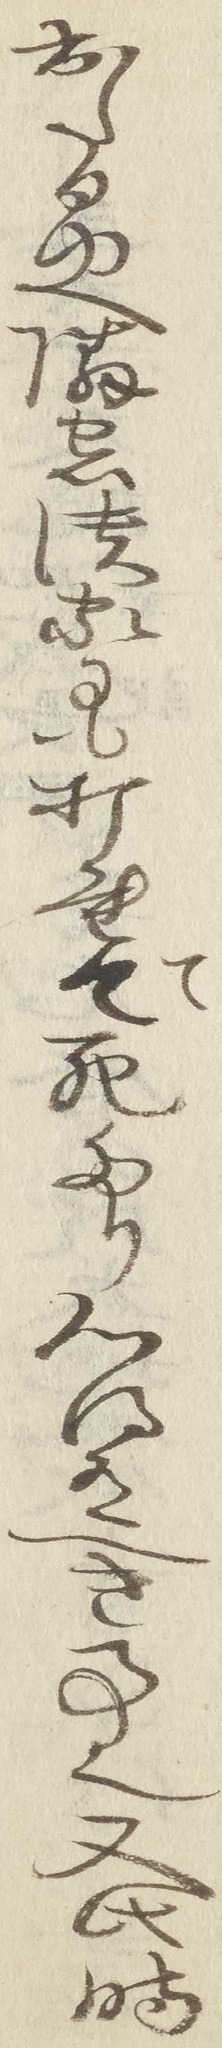出たるゆへ隣宿潰家にも打れて死たり心得有へき事也又此時
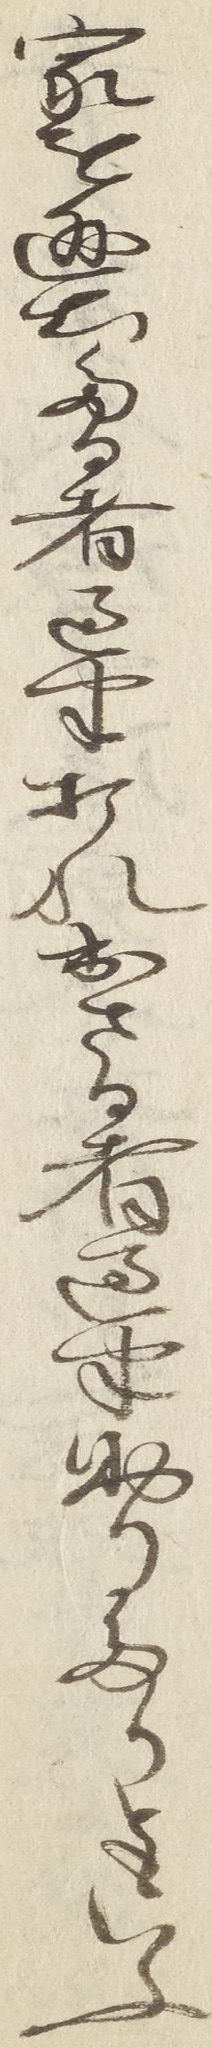家を逃出たる者過半打れ出さる者過半助りたりともいふ
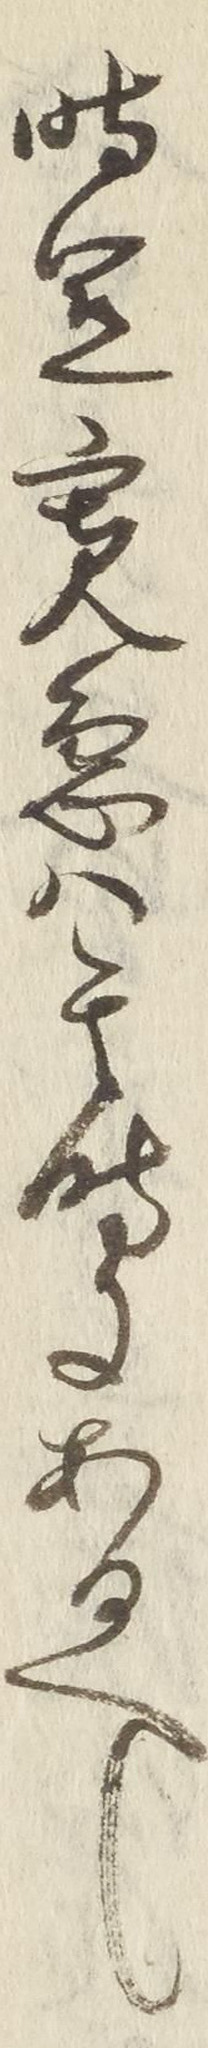時宜寛急は其時にあるへし
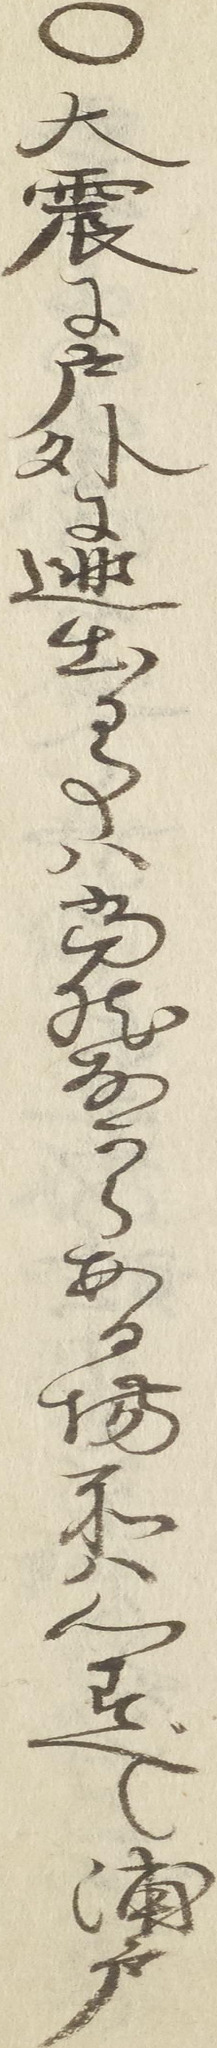○大震に戸外に逃出る事は当然なからある場所は心すへし浦戸
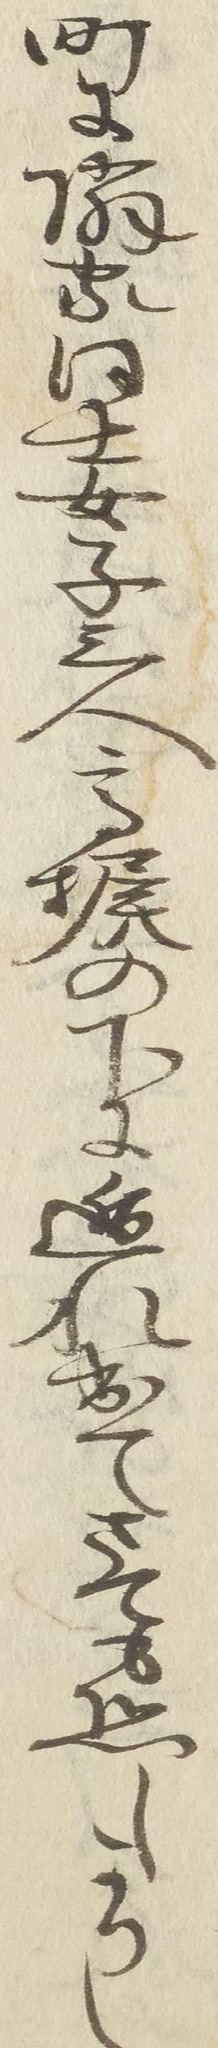町に隣家同士女子三人高塀の下に遁れ出てさても恐しかりし

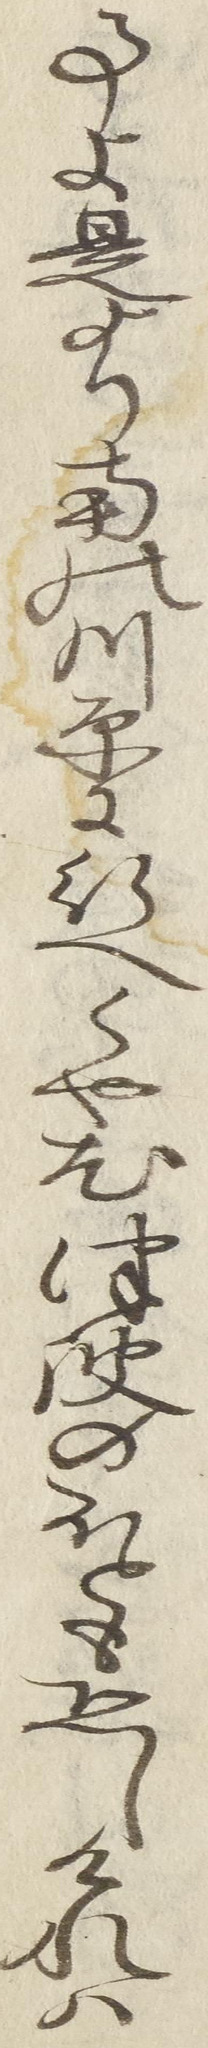事よ是より南の川原に行へくや尤津波のほとも恐しけれは
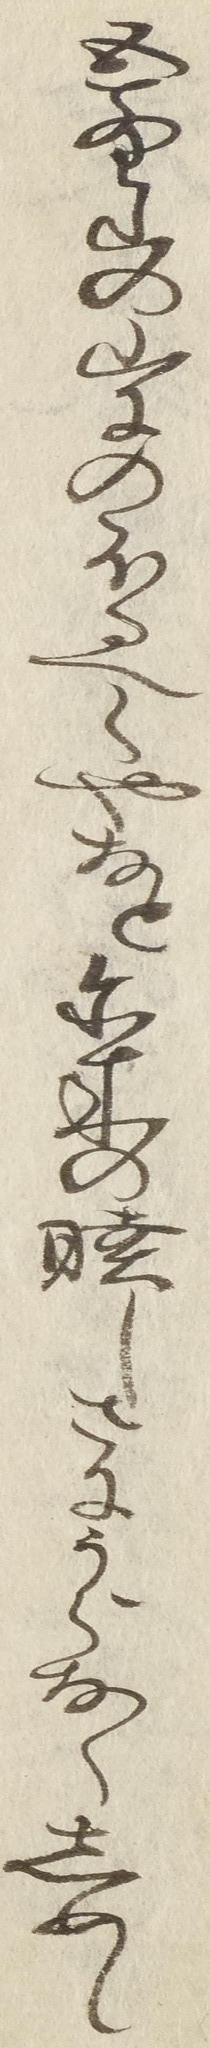五台山の山にのほるへしやなと尓来の睦しさにうらなくしめし
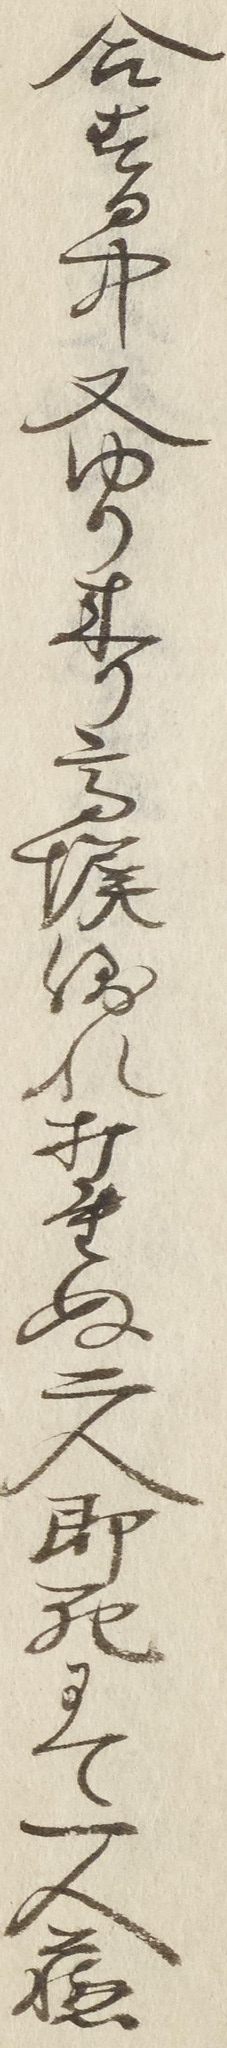合する中又ゆり来り高塀倒れ打れぬ二人即死にて一人蘇
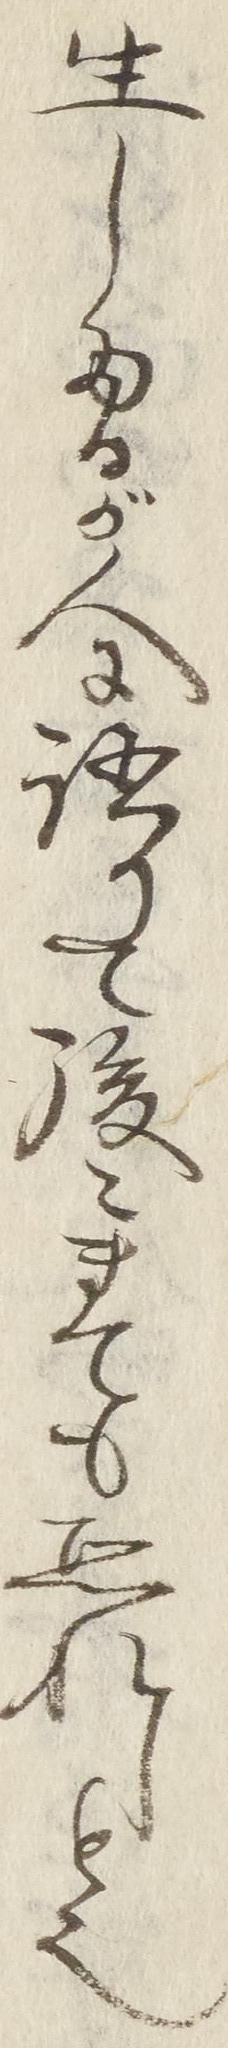生したるが人に語りて後々まても恐れしと也
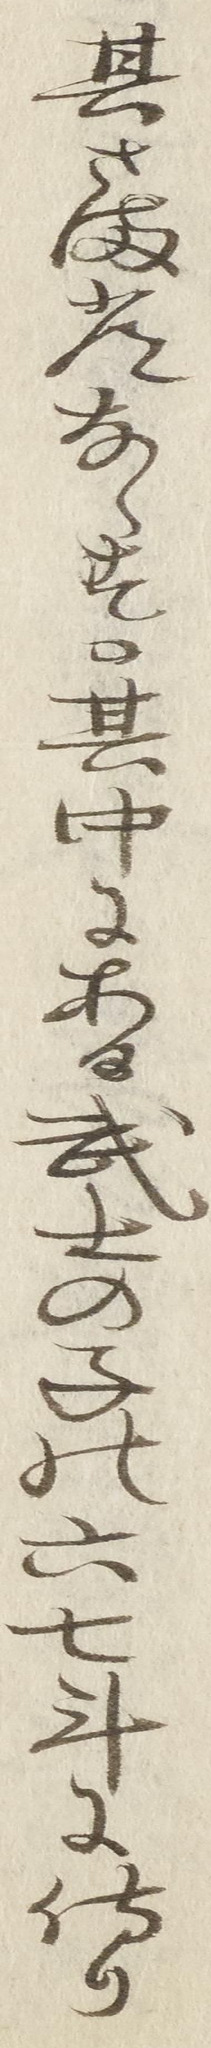其さま常ならす○其中にある武士の子の六七計に侍り
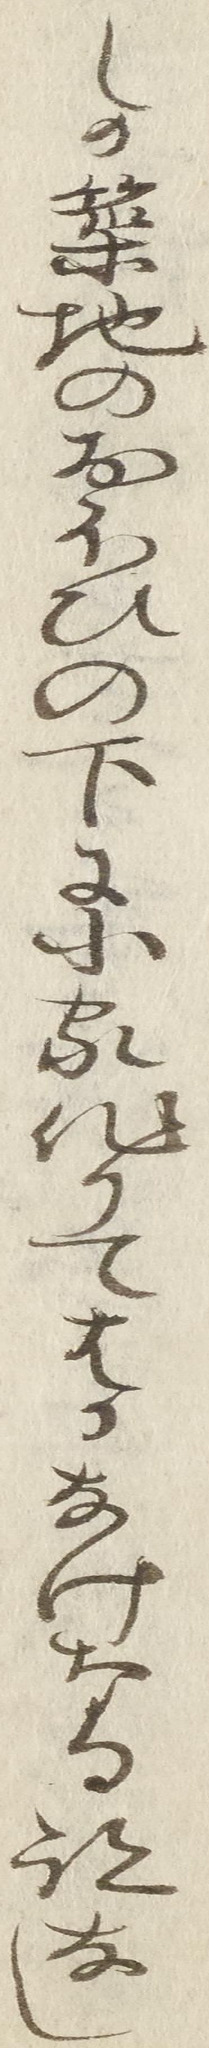しか築地のおほひの下に小家作りてはかなけなる跡なし
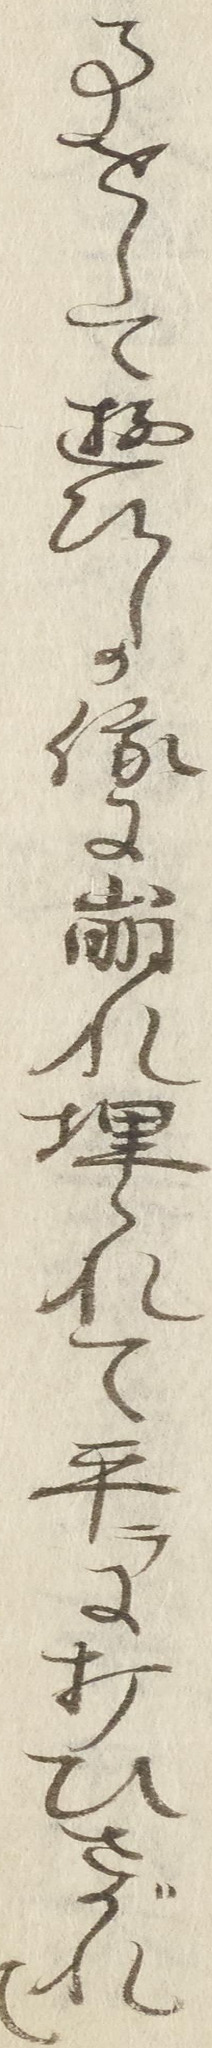事をして遊ひしか俄に崩れ埋られて平ラに打ひさがれて
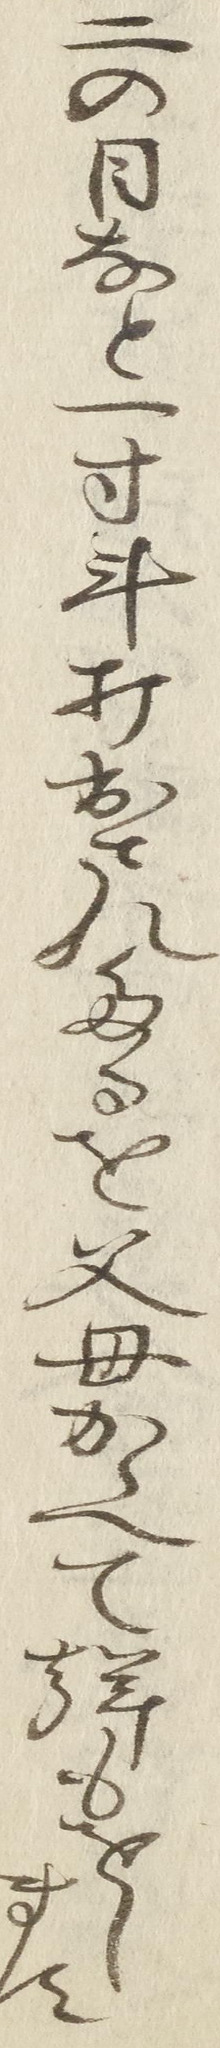二の目なと一寸計打おされたるを父母かゝへて辨もをします
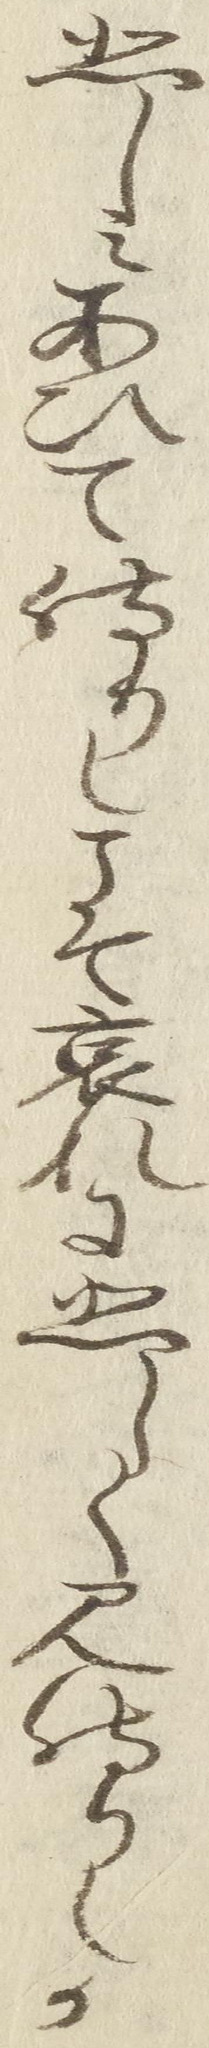悲しみあひて侍りしこそ哀れに悲しく見侍りしか
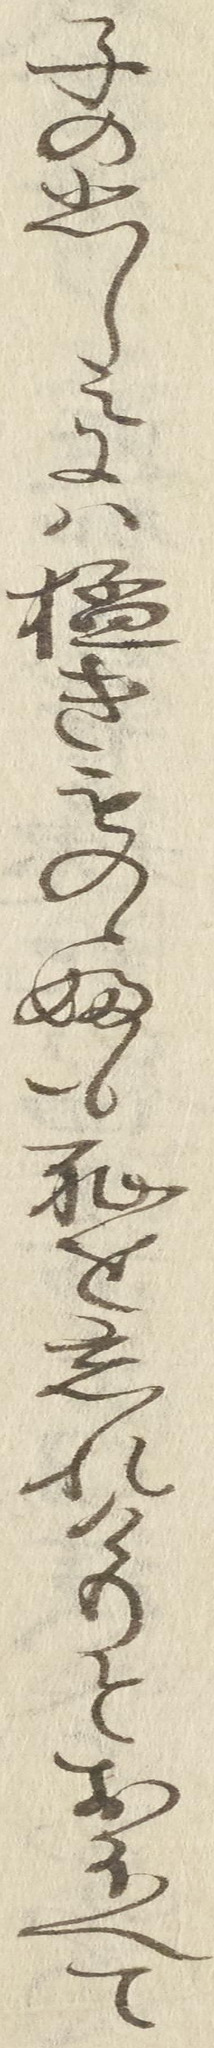子の悲しみには猛きものゝふも恥を忘れけもをおほへて
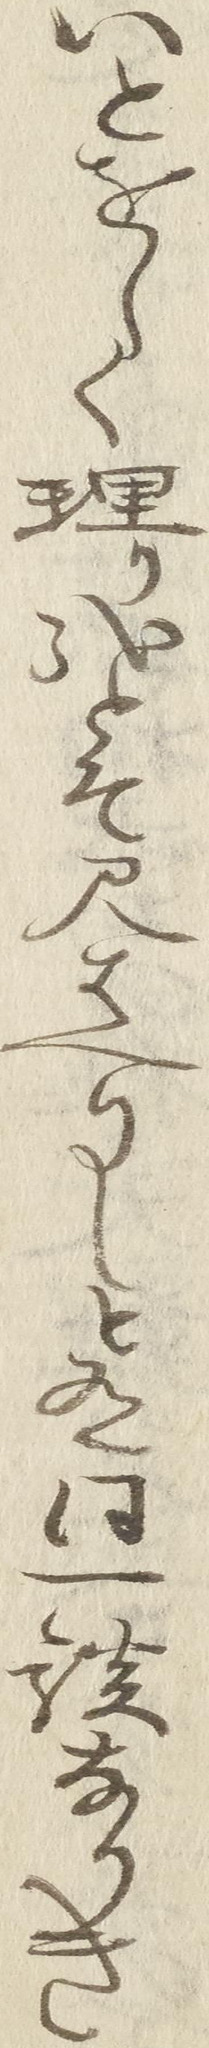いとをしく理り哉とそ見はへりしと有同一談なりき
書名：地震記　上
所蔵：東京大学地震研究所図書室 Earthquake Research Institute Library, The University of Tokyo, JAPAN
